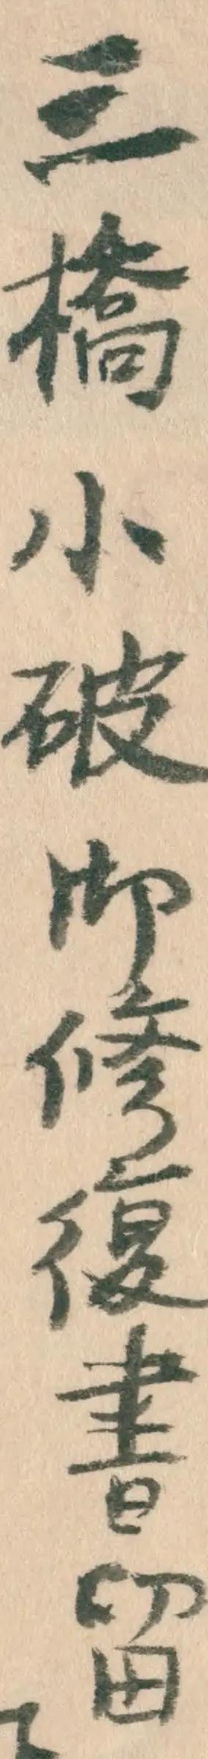三橋小破御修復書留下

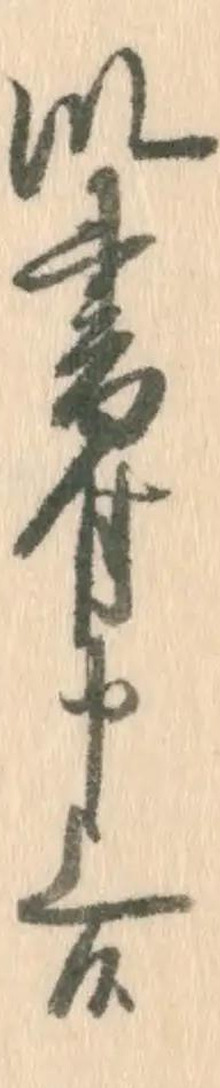以書付申上候
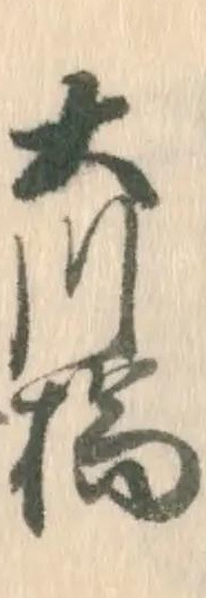大川橋
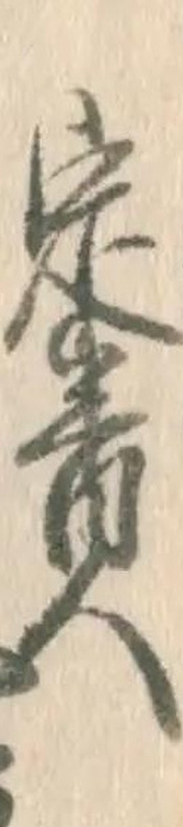定番人
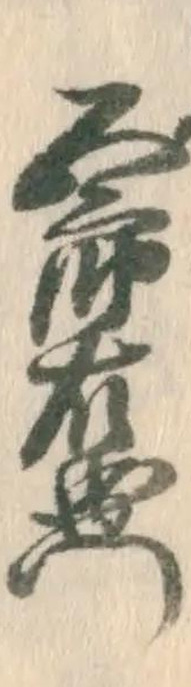五郎右衛門
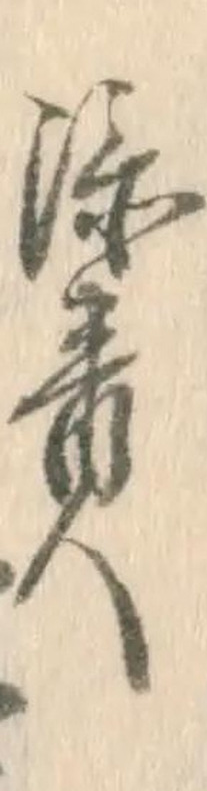添番人
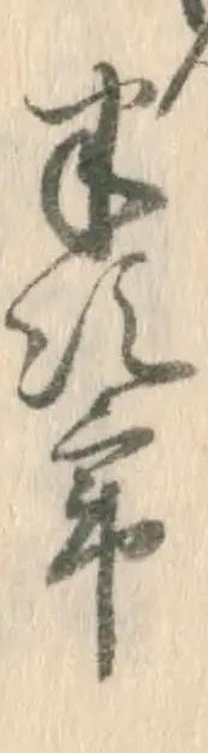半次郎
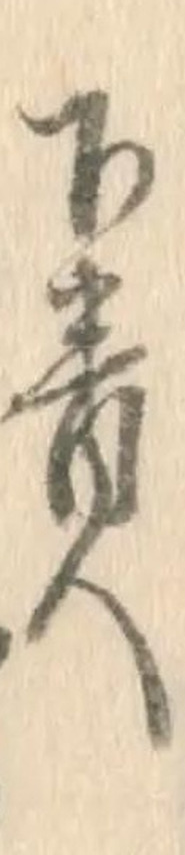下番人
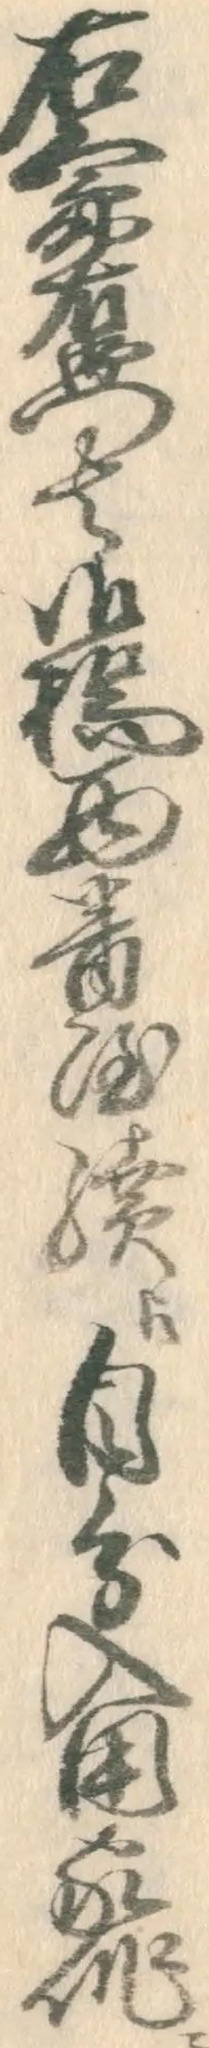右五郎右衛門は御橋西番屋続え自分入用家作ニ
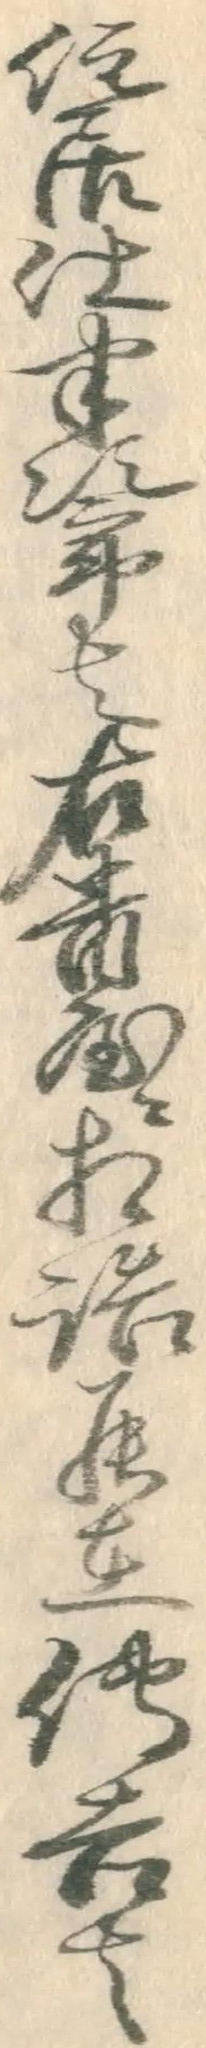住居仕半次郎は右番屋ニ相詰罷在伝吉は
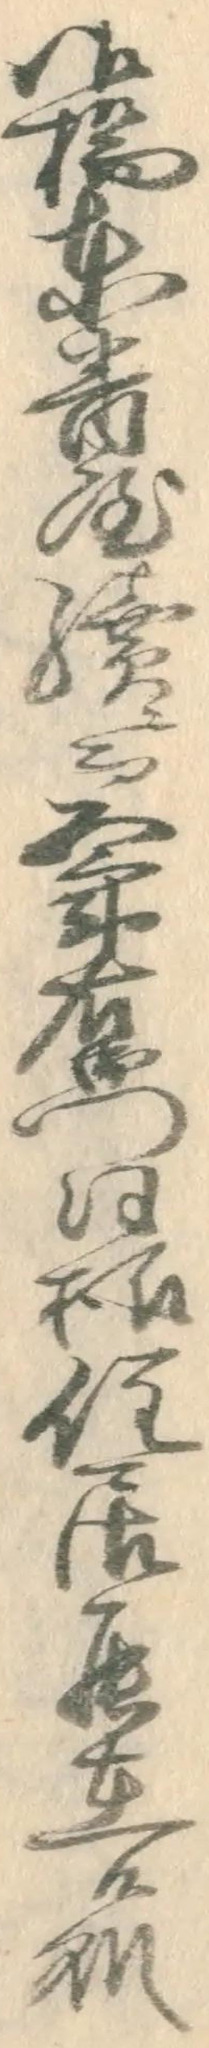御橋東番屋続ニ而五郎右衛門同様住居罷在候処

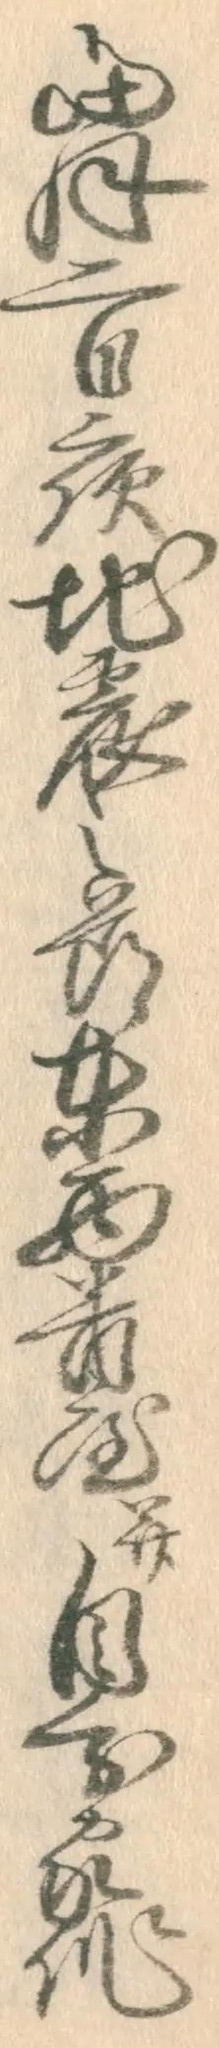当月二日夜地震之節東西番屋并自分家作
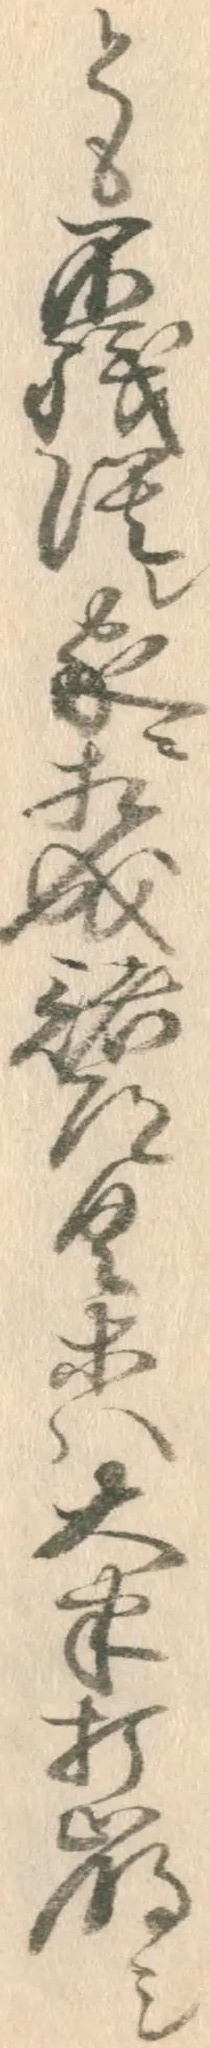とも不残潰レ家ニ相成諸道具等ハ大半打崩シ
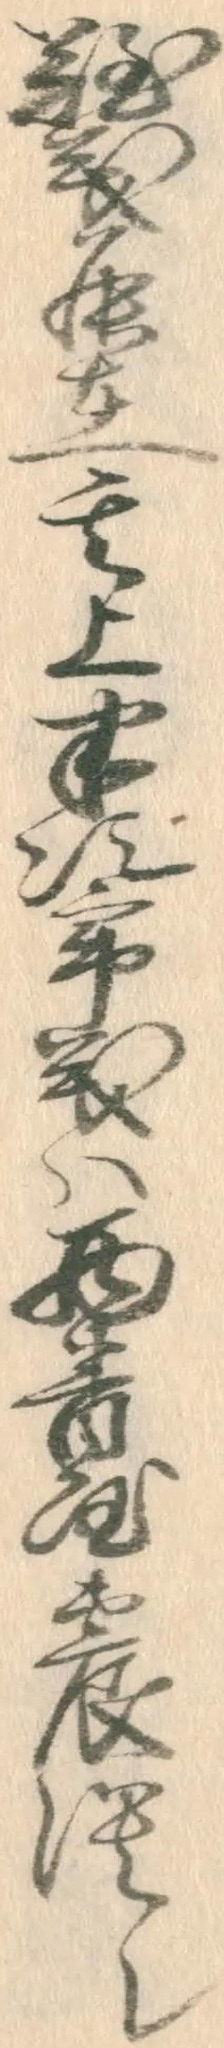難義罷在其上半次郎義ハ西番屋震潰レ
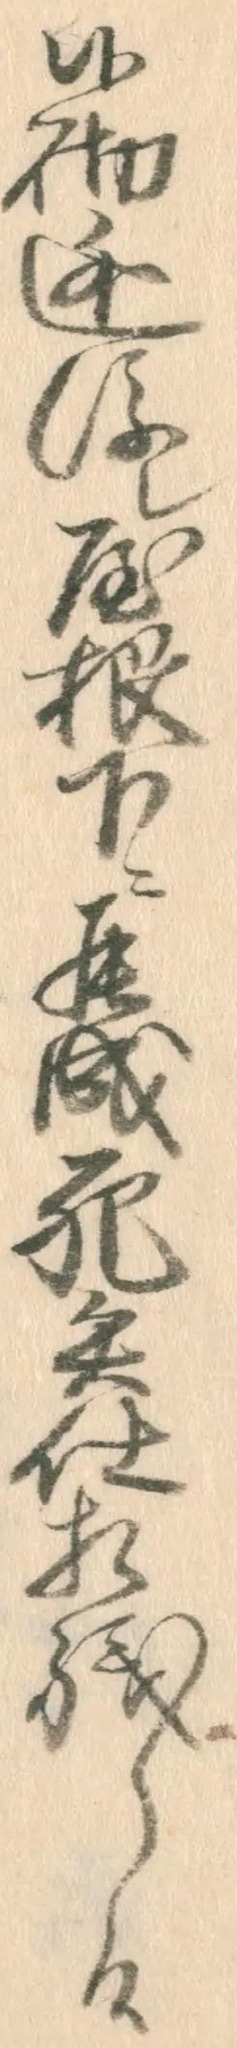候砌逃後レ屋根下ニ罷成死失仕相残り候
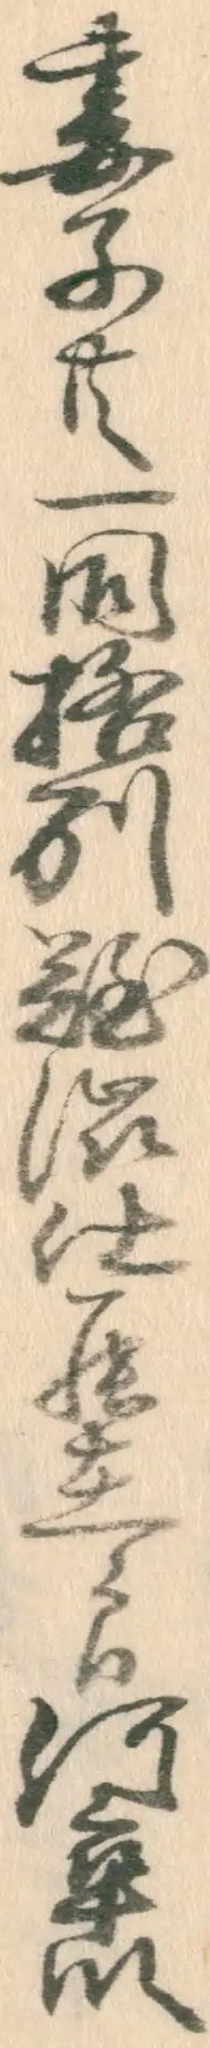妻子共一同格別難渋仕罷在候間何卒以
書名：三橋 17巻. [8] 三橋小破御修復書留　但御奉行御掛リ替地震潰橋番屋　嘉永四亥年より安政二卯年迄　下
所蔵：国立国会図書館 National Diet Library, JAPAN
